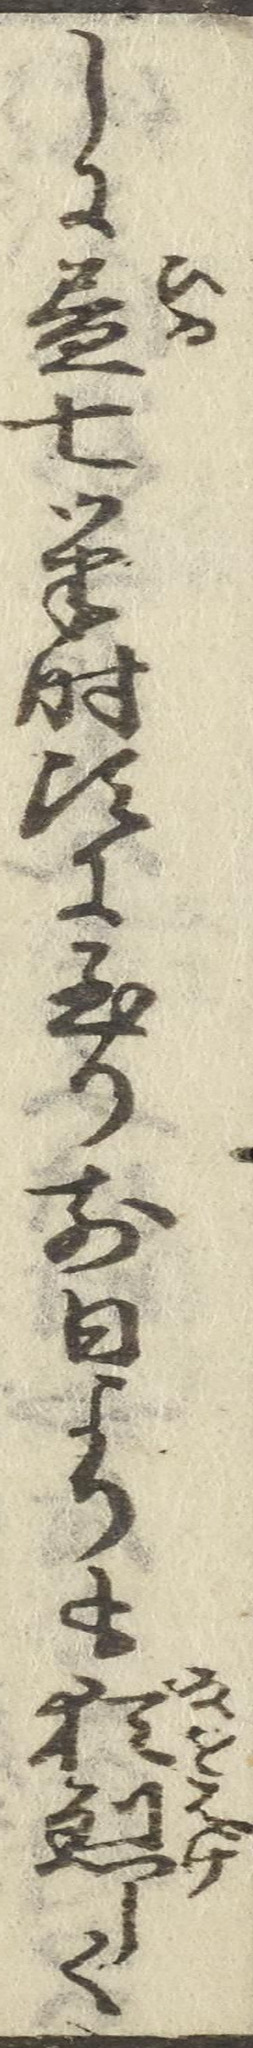しに昼七ツ半時頃に至り前日よりも猶烈しく
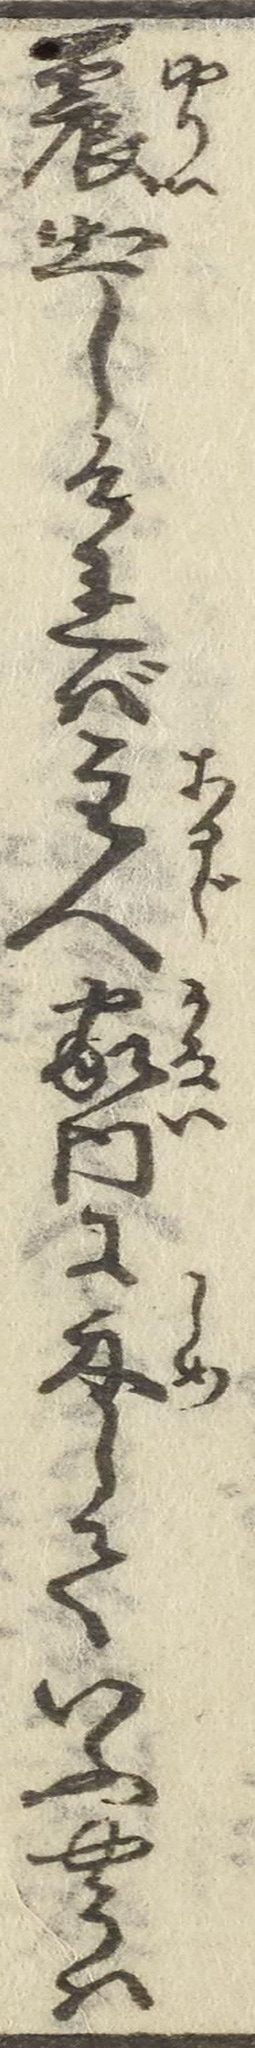震出しければ主人家内に示していふやうは
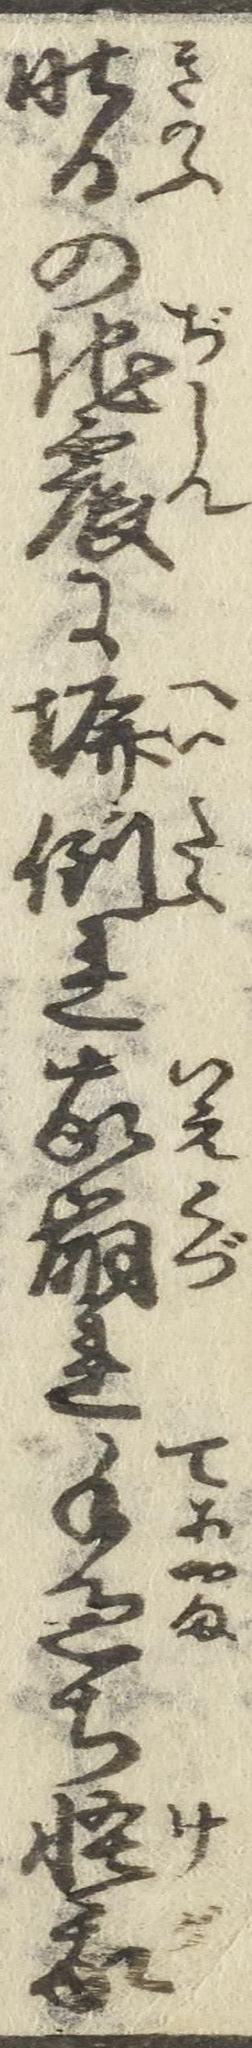昨日の地震に塀倒れ家崩れ手過ち怪我
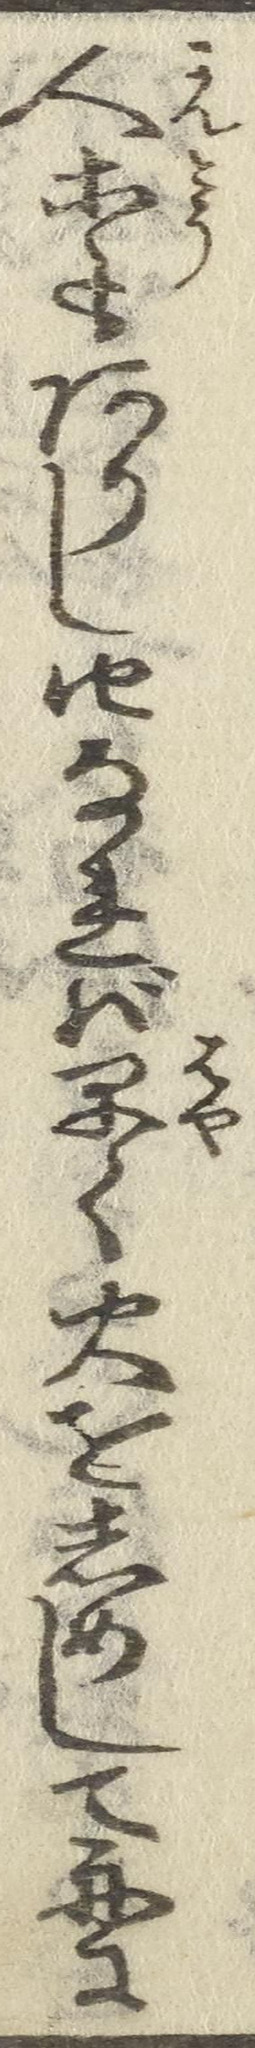人等もありし由なれば早く火をしめして舟に
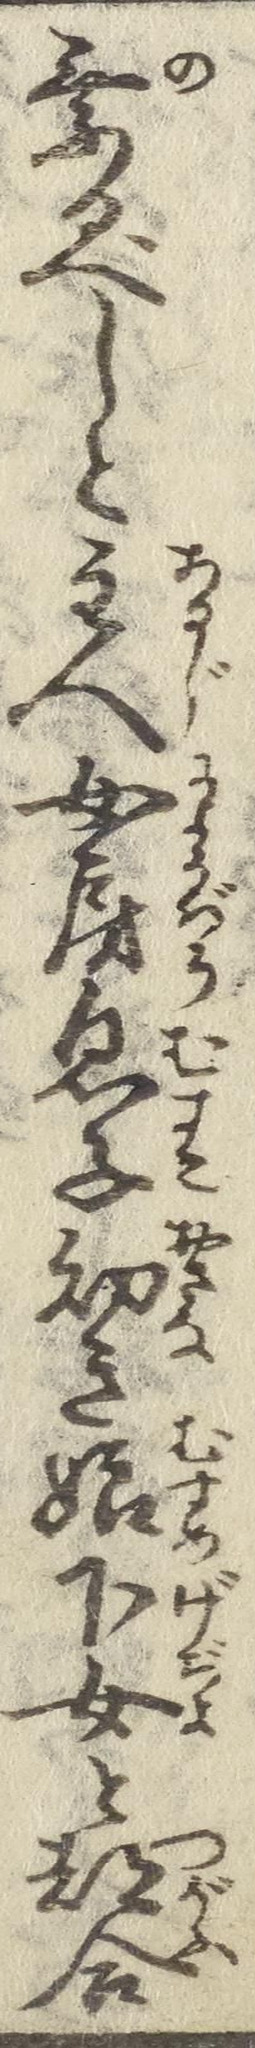乗るべしと主人女房息子幼き娘下女と都合
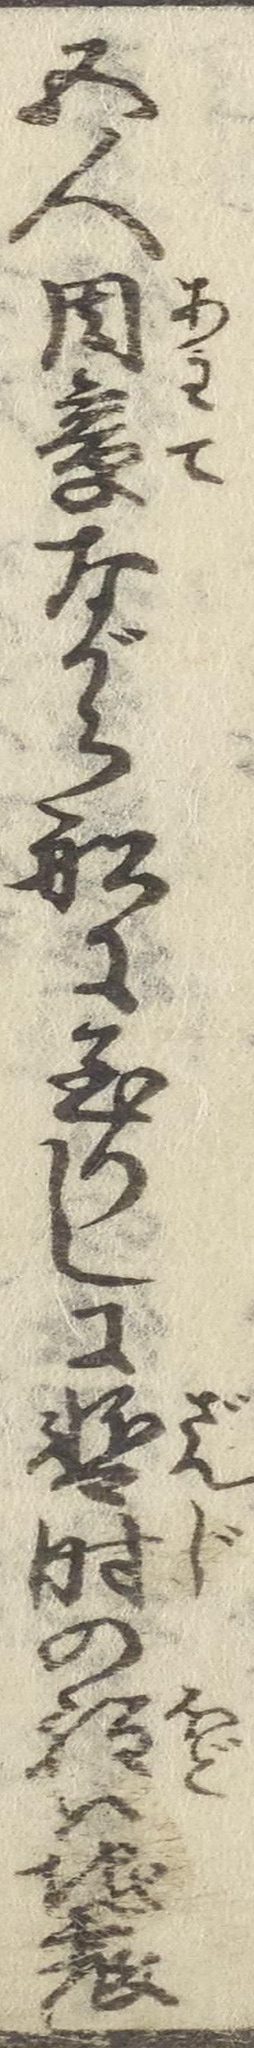五人周章ながら船に至りしに暫時の程は地震
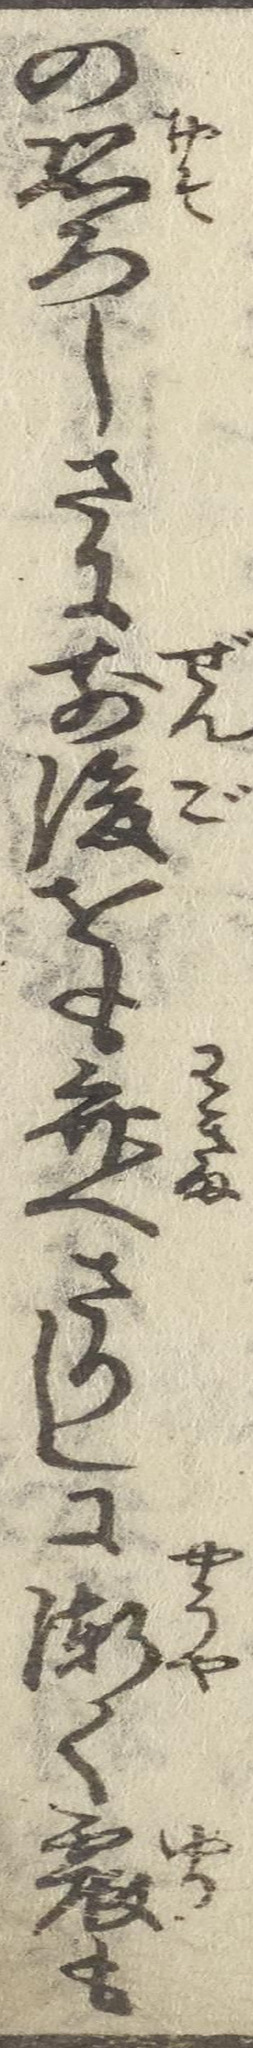の恐ろしさに前後をも弁へさりしに漸く震も

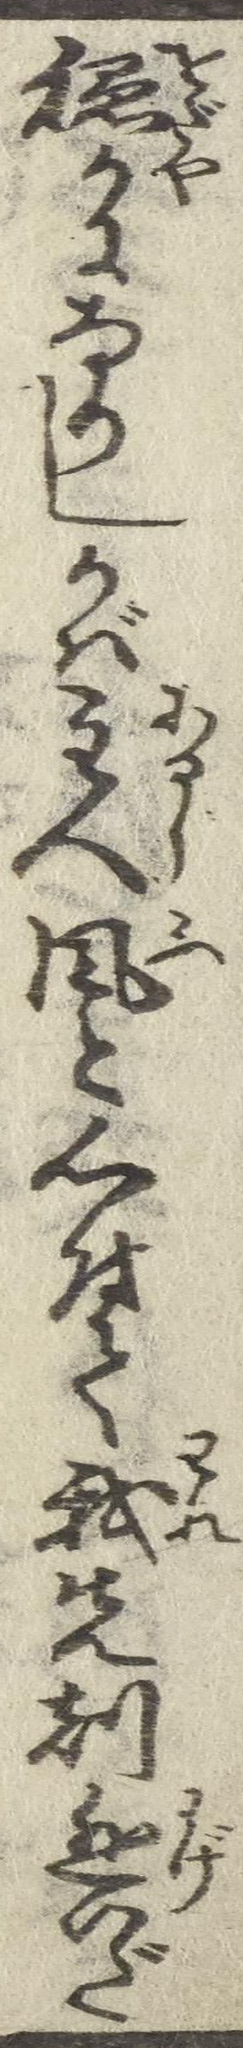穏かになりしかば主人風と心付て我先刻逃いだ
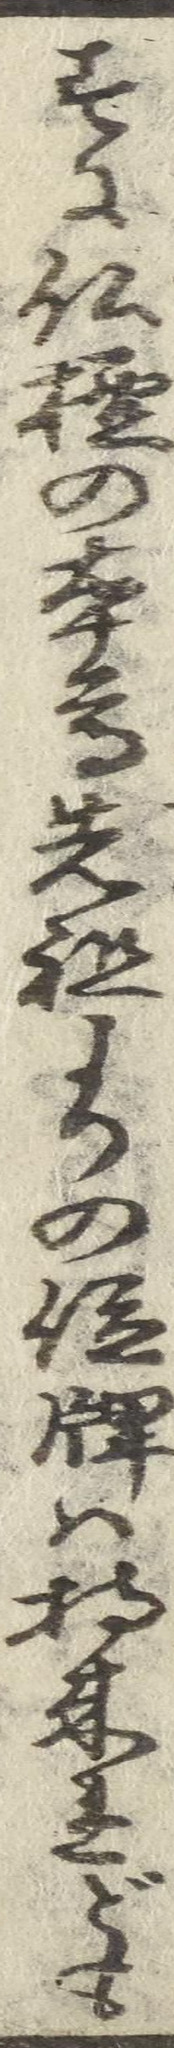すに仏檀の本尊先祖よりの位牌は持来れども
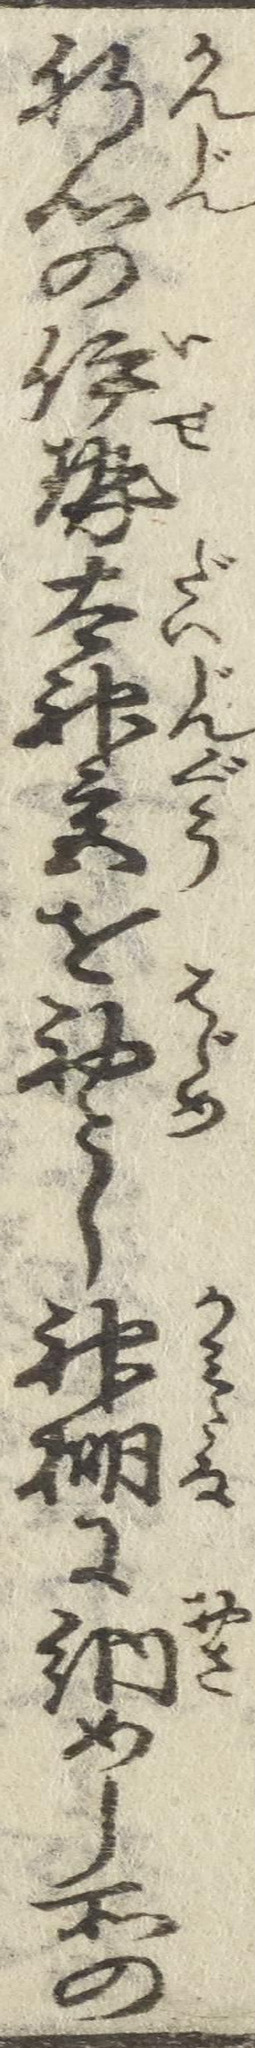肝心の伊勢太神宮を初とし神棚に納めし所の
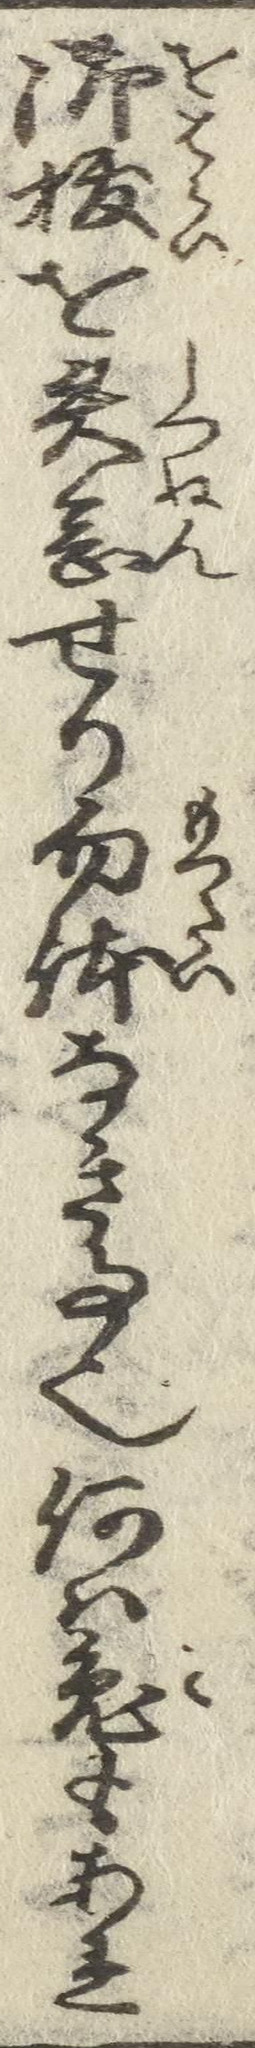御祓を失念せり勿体なき事也何は兎もあれ
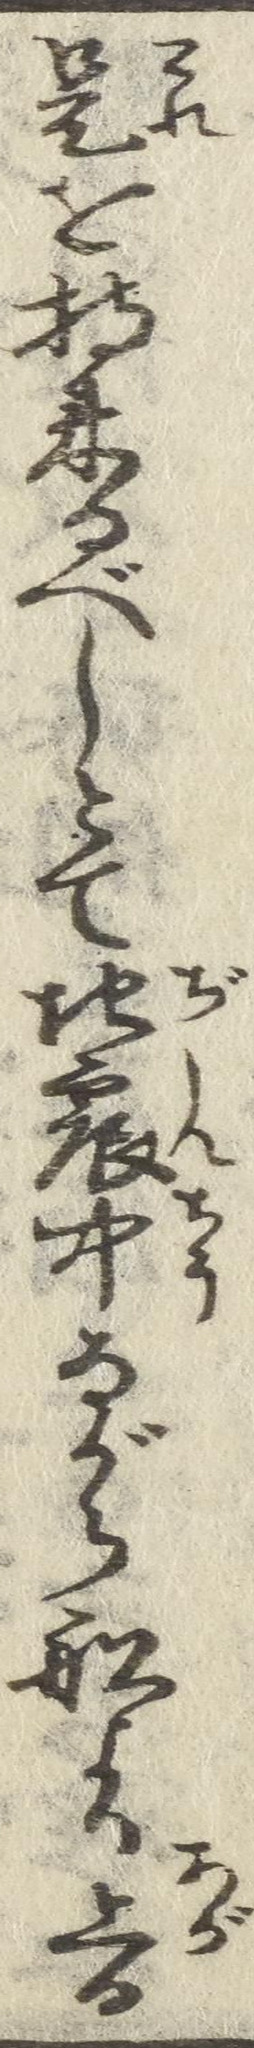是を持来るべしとて地震中ながら船より上る
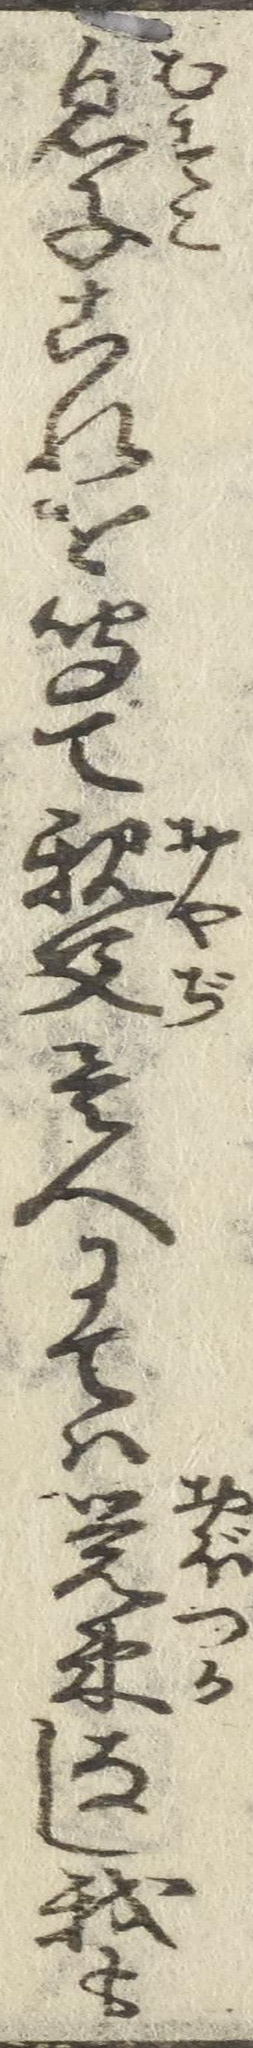息子これを聞て親父壱人にては覚束なし我も
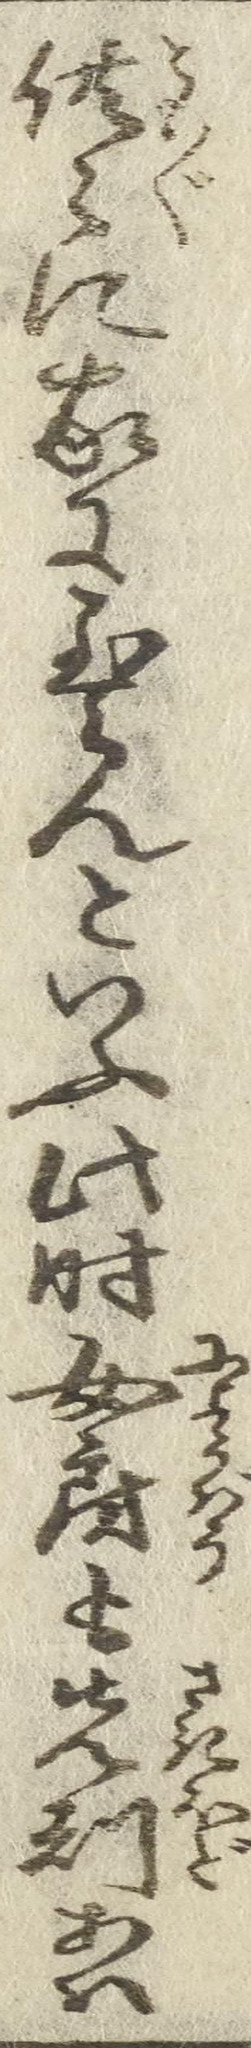共々に家に至らんといふ此時女房も先刻あは
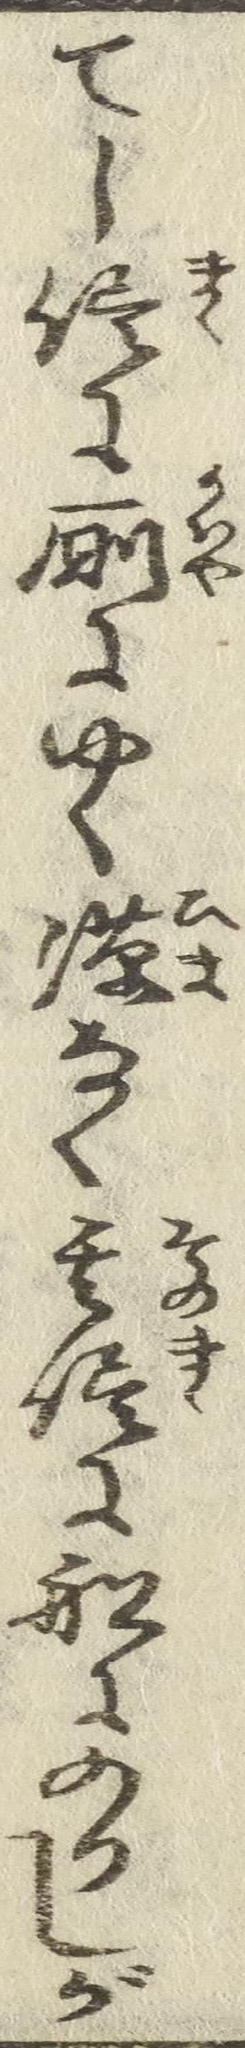てし侭に厠にゆく隙なく其侭に船にのりしが
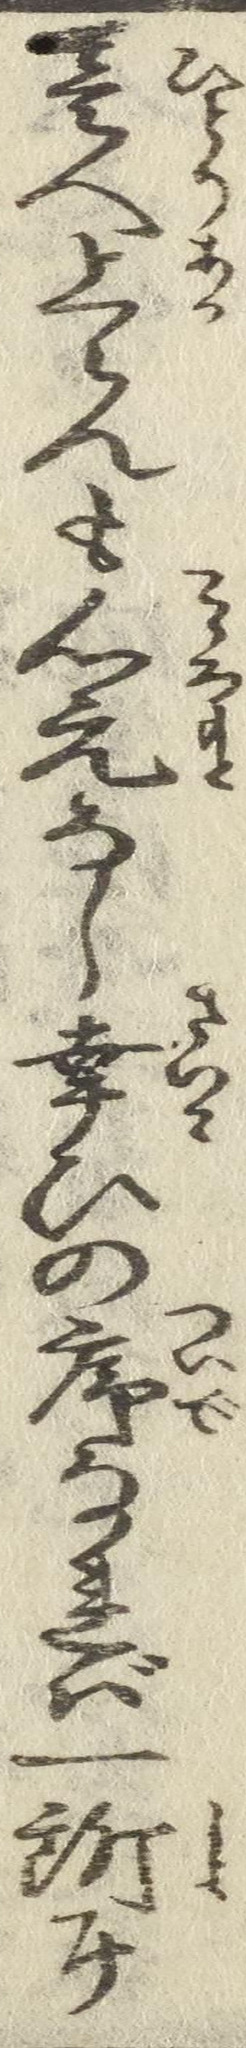壱人上らんも心元なし幸ひの序なれば一所に
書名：大地震　津涛乃奇談　第二集
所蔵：東京大学地震研究所図書室 Earthquake Research Institute Library, The University of Tokyo, JAPAN
